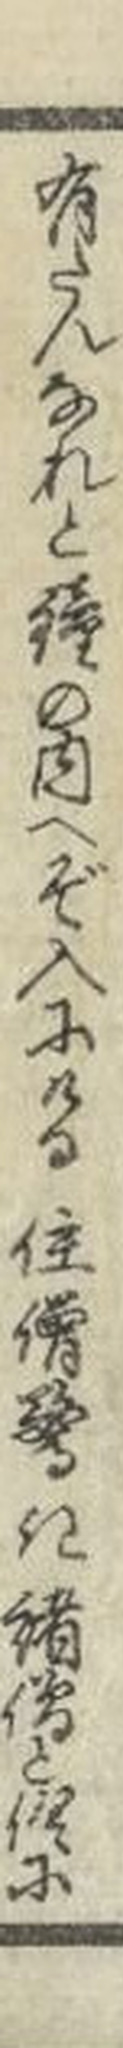有たんなれと鐘の内へぞ入にける住僧驚き緒僧と供に
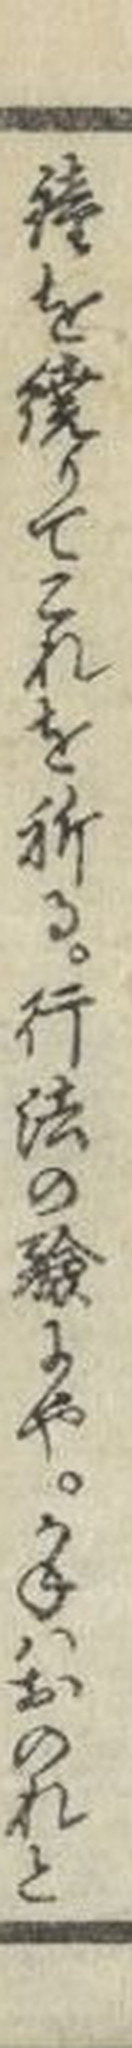鐘を繞りてこれを祈る。行法の験にや。かねはおのれと
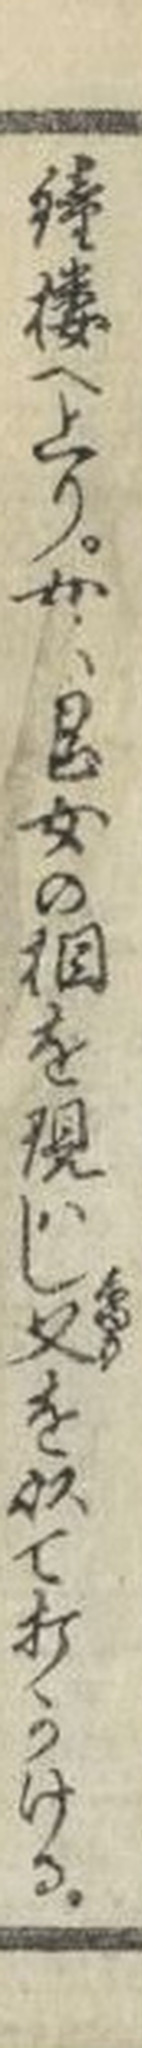鐘楼へ上り。女は鬼女の相を現はしを以て打かける。
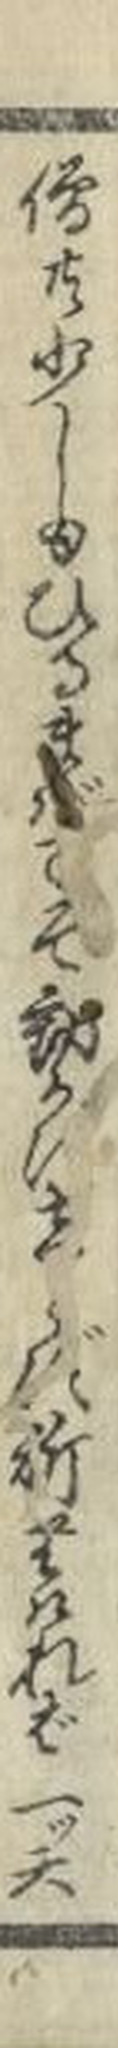僧其少しもひるまそ動かしらず祈りければ一ツ天
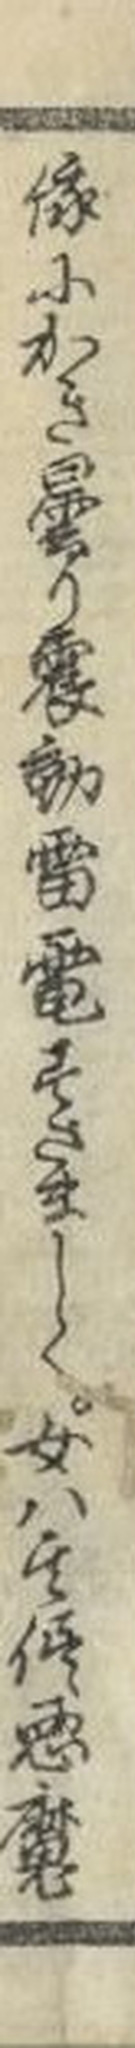にかき曇り震動雷電すさましく。女は其儘悪魔
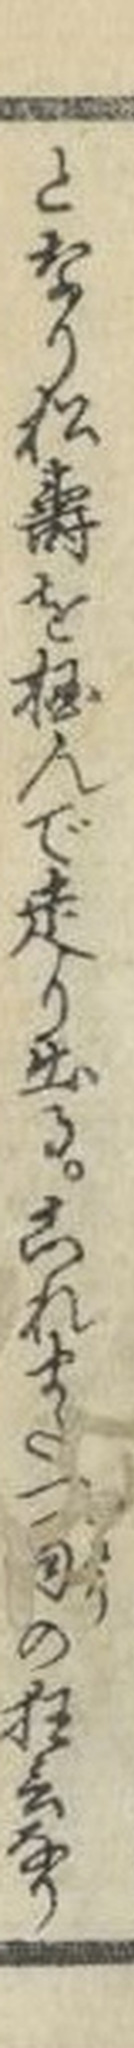となり松寿を掴んで走り出る。これまた一局の狂言なり
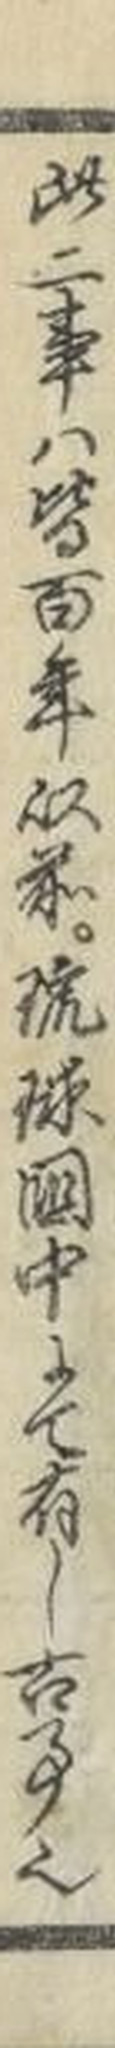此二事は皆百年以前。琉球国中にて有し古事也
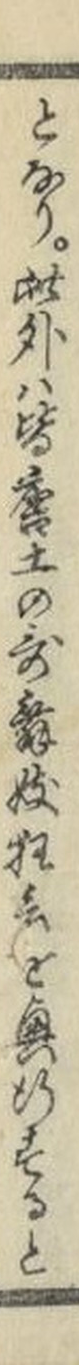となり。此外は皆唐土の哥舞妓狂言を興行すると
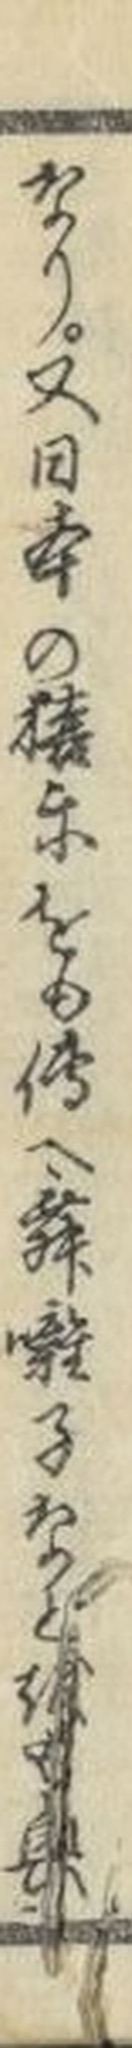なり。又日本の猿楽をも伝へ舞囃子なとをも興
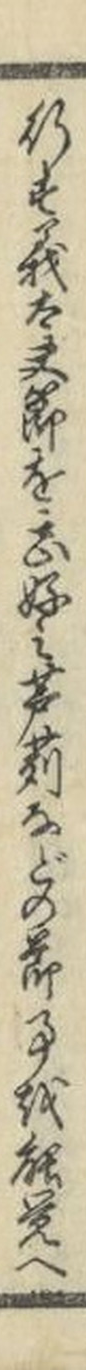行す義太夫節を好み芦茢などの節事を能覚へ
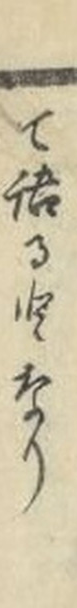て語るとなり
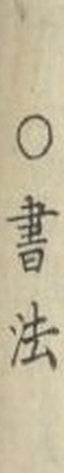○書法
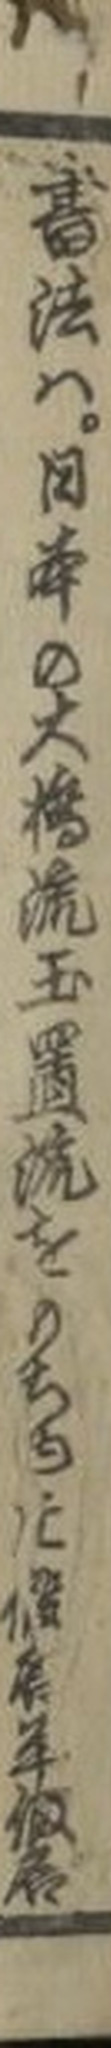書法は。日本の大橋流玉置流をもちゆ片仮名平仮名
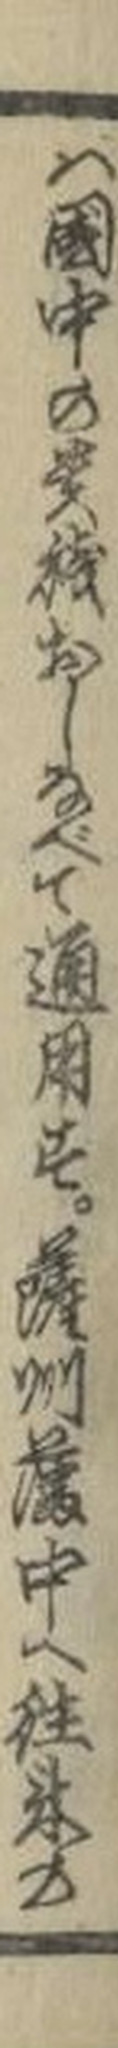は国中の貴賤おしなべて通用す。薩州藩中へ徃来の
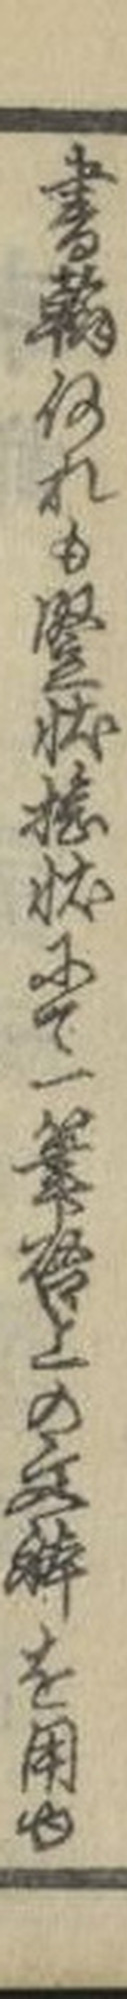書翰何れも竪状状にて一筆啓上の文躰を用ゆ
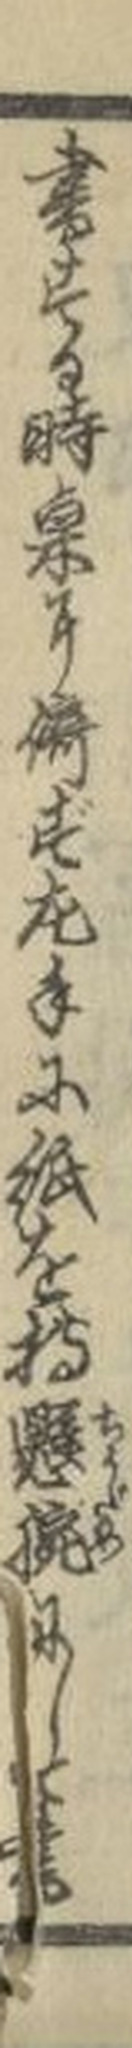書する時桌に倚ず左手に紙を持懸腕にして書
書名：琉球解語
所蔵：University of the Ryukyus Library
